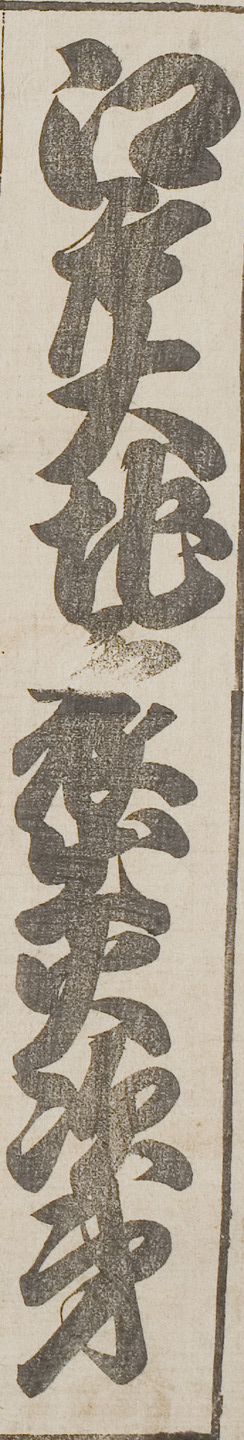江戸大地震出火次第
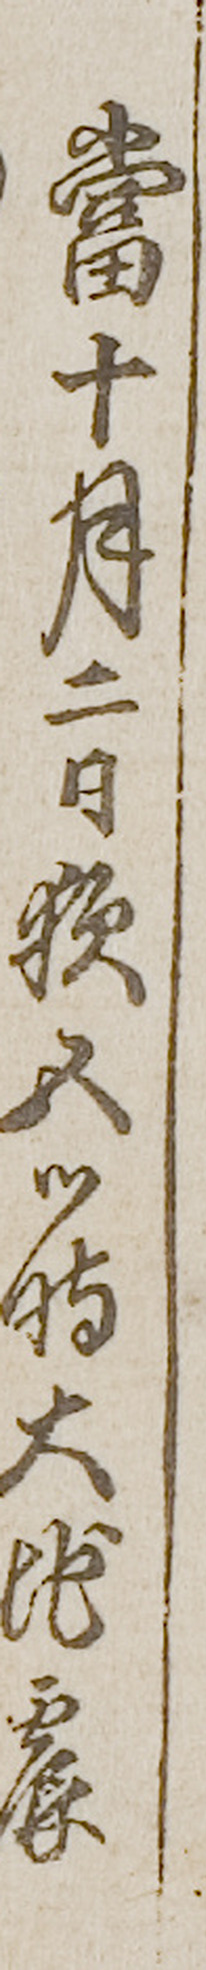當十月二日夜五ツ時大地震
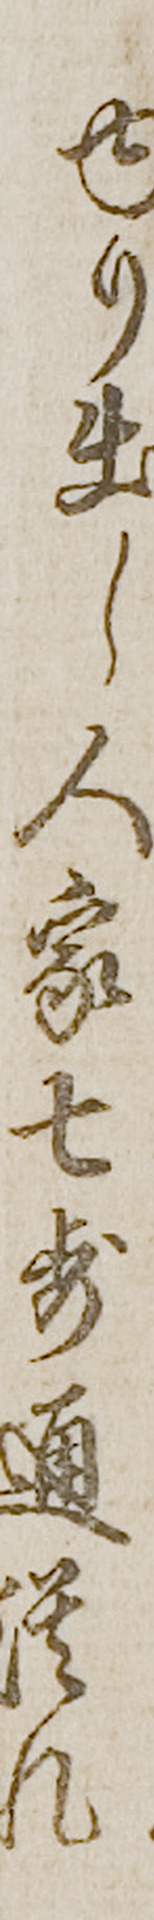ゆり出し人家七歩通潰れ
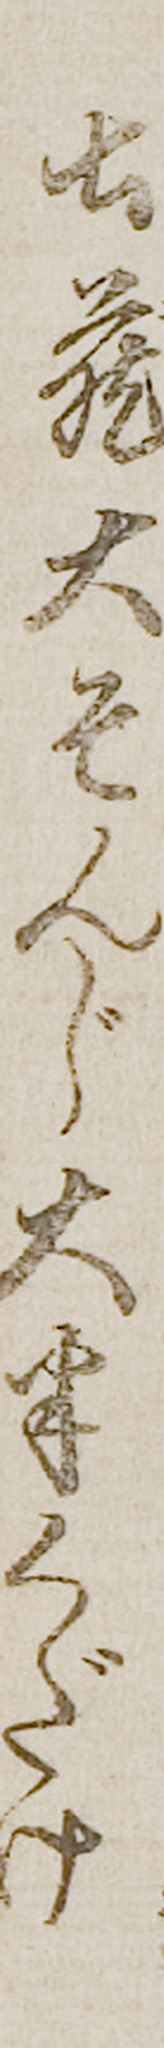土蔵大そんじ大半くだけ
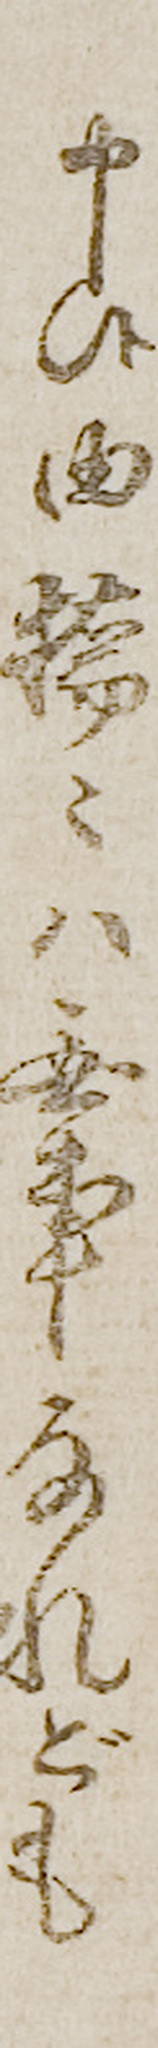申候由橋〻ハ無事なれども
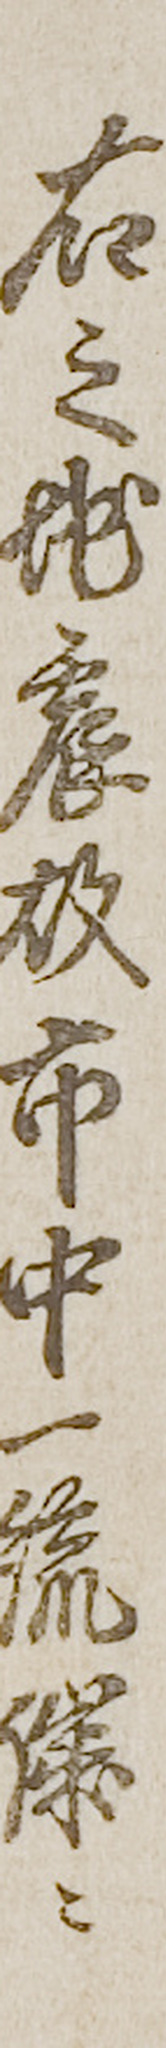右の地震故市中一統誠に
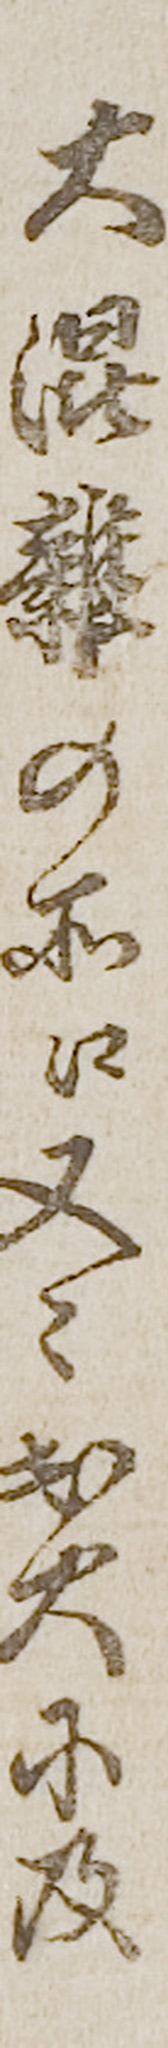大混雑の所江又〻出火に及
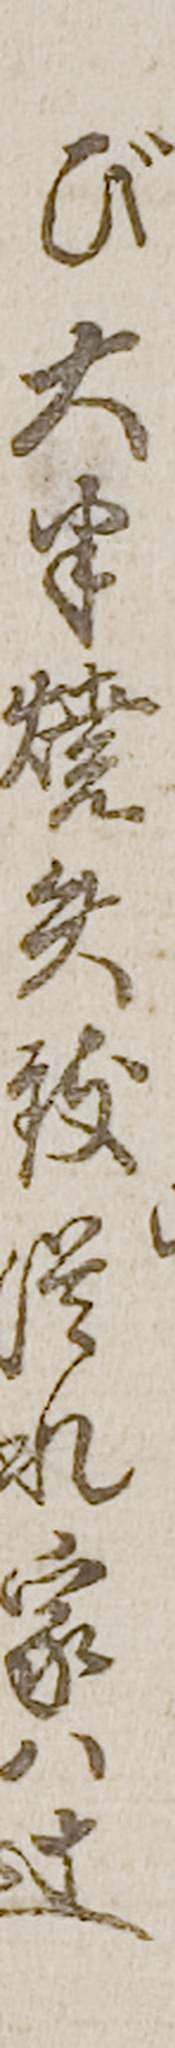び大半焼失致潰れ家ハ辻
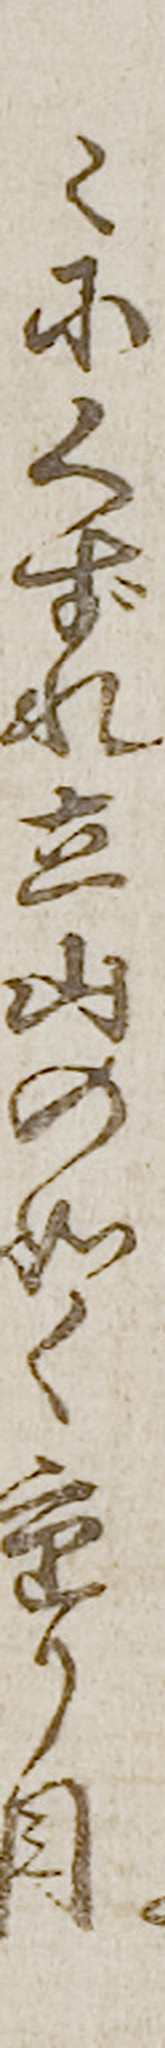〻にくずれ立山の如く重り目
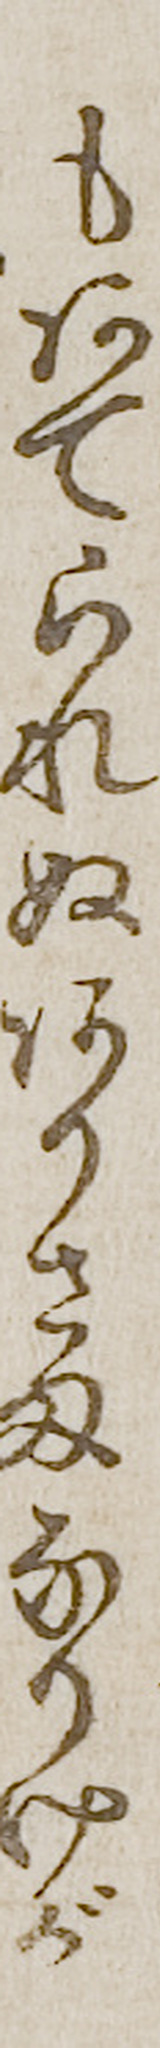もあてられぬありさまなりけが
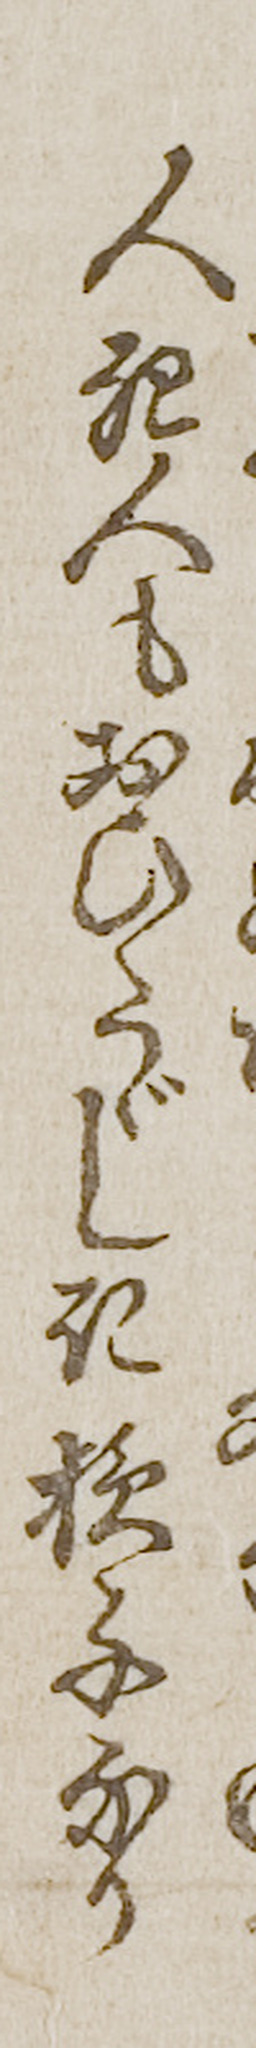人死人もおひたゞしき様子なり
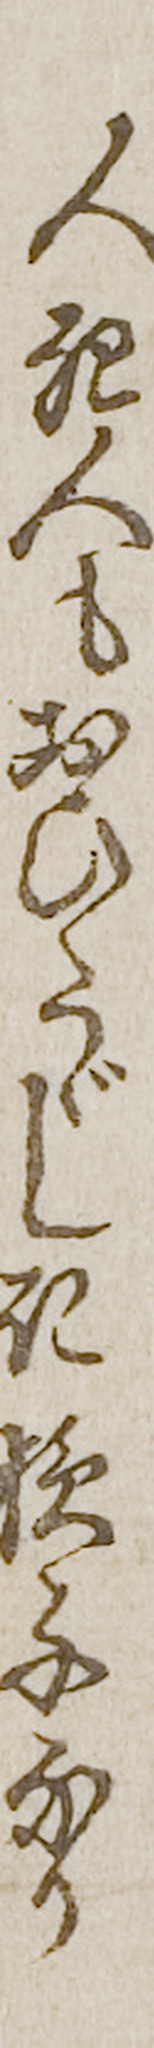人死人もおひたゞしき様子なり
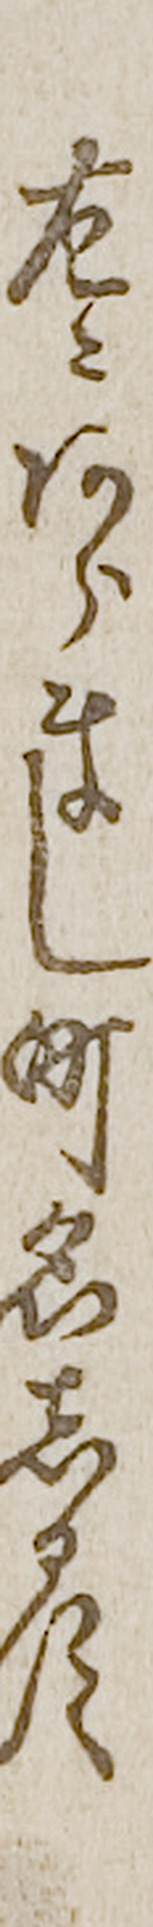左ニあらまし町名しるす
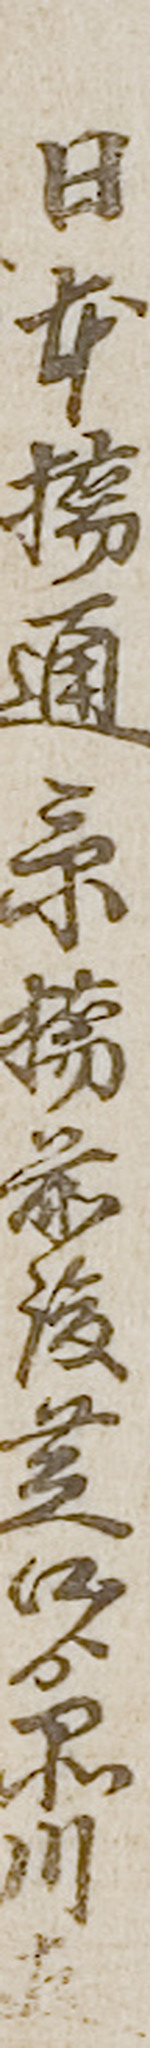日本橋通京橋前後芝口ゟ品川迄
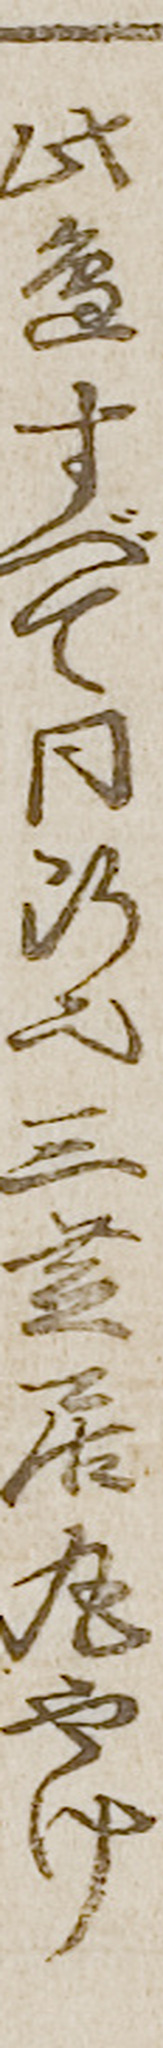此邊すべて同断也三芝居丸やけ
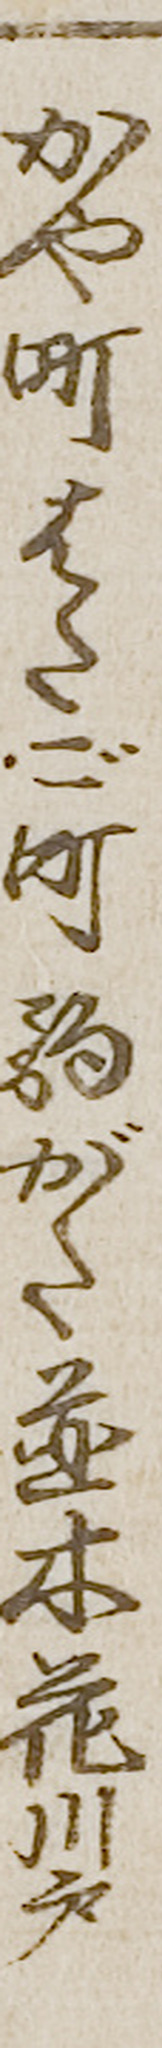かや町はたご町駒がた並木花川戸
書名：江戸大地震出火次第
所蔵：東京大学総合図書館 General Library in the University of Tokyo, JAPAN
